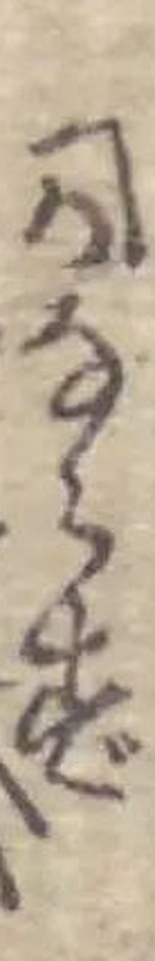〽かならず
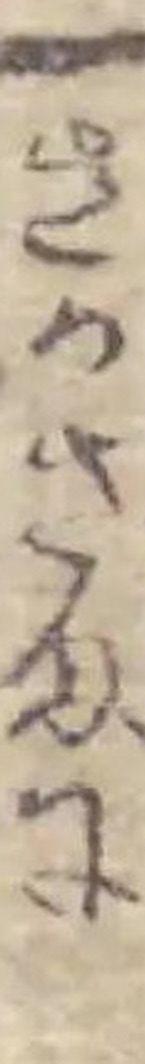さかさまに
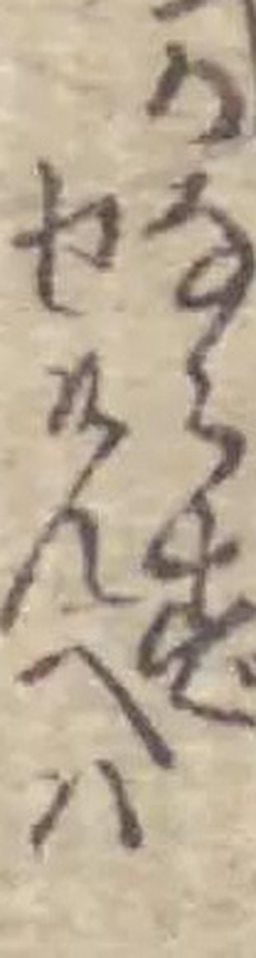せけんへは
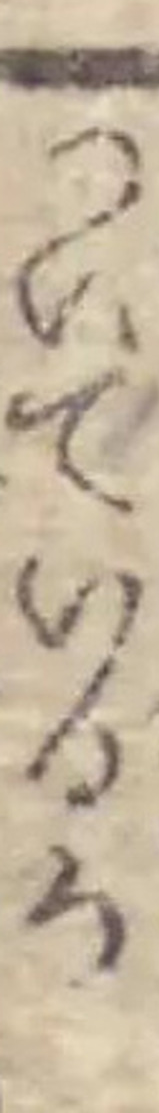ついているか
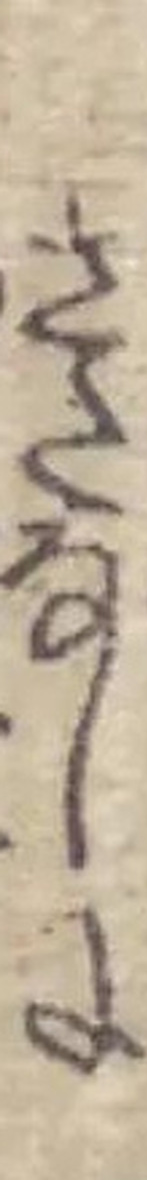さたなしに
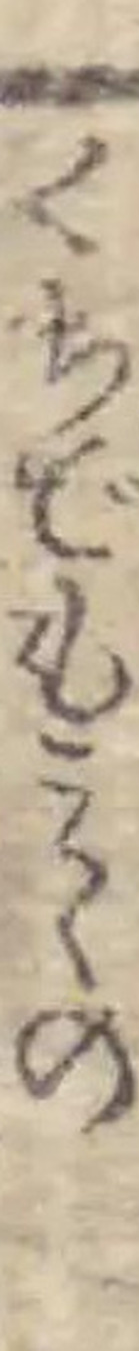くちでもみゝの
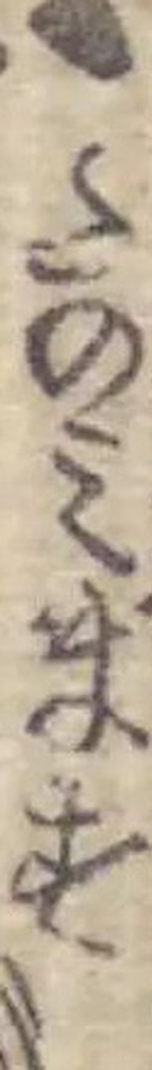たのみます
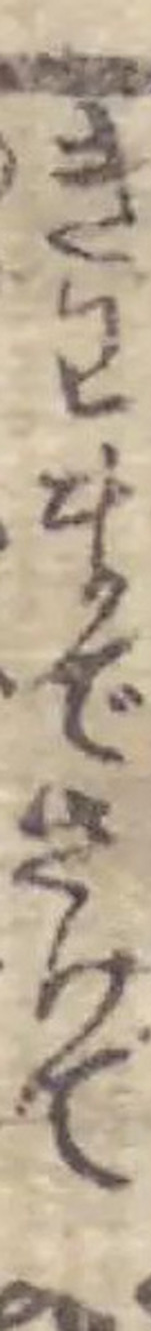きわまでさけて
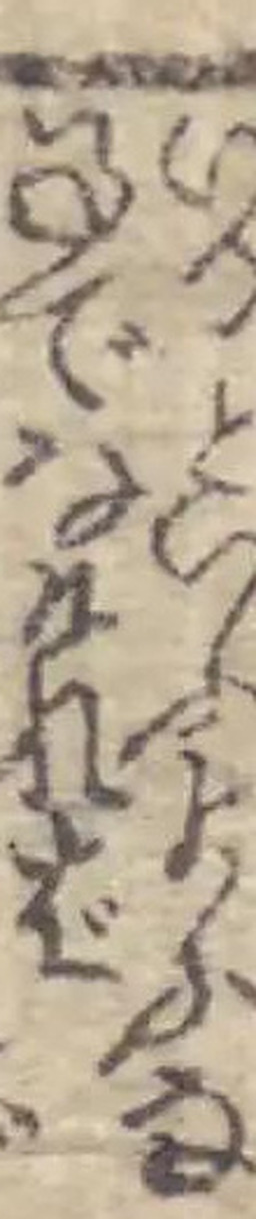事でなければ
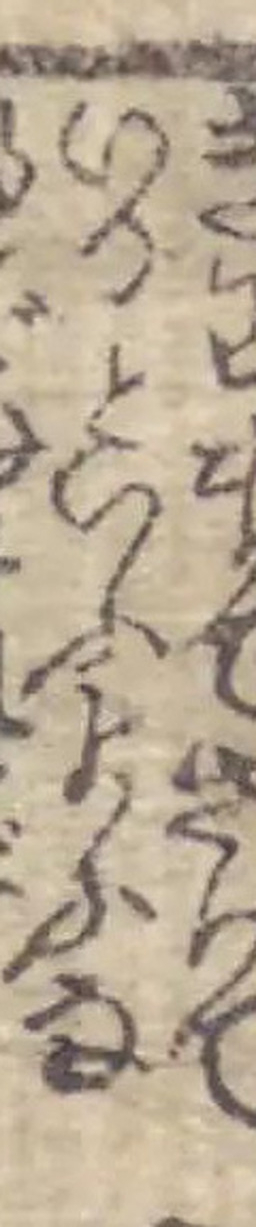いるといふよふな
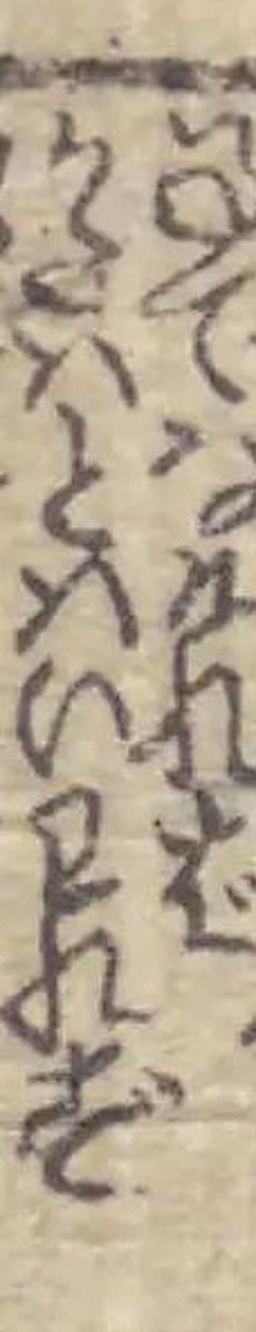かたはとはいわれず
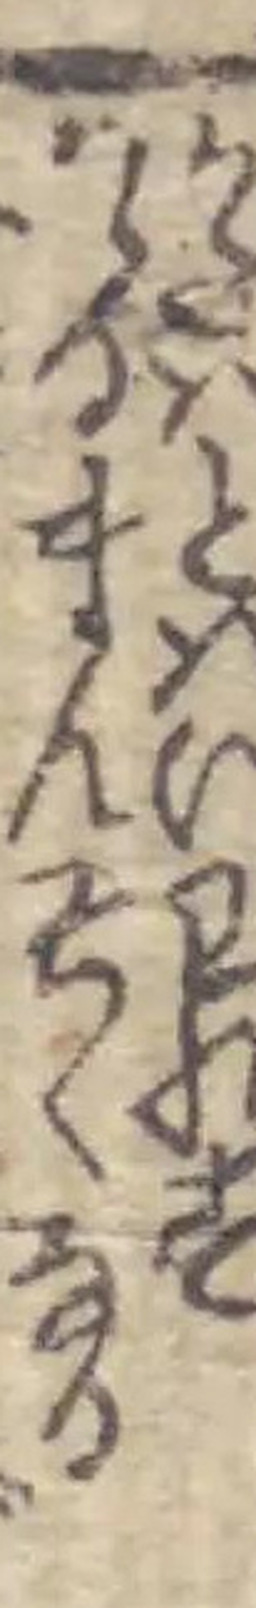かゝるまんそくなる
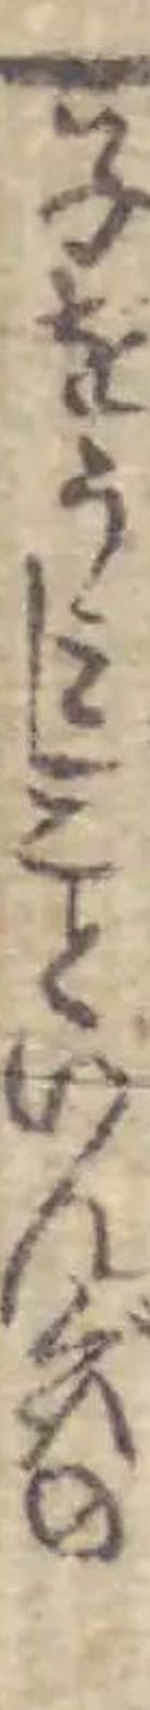子をうみしこといんぐはの
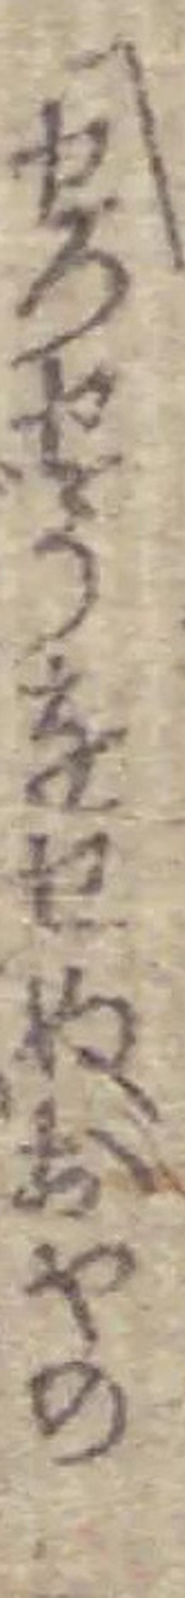〽せつせうをせぬおやの
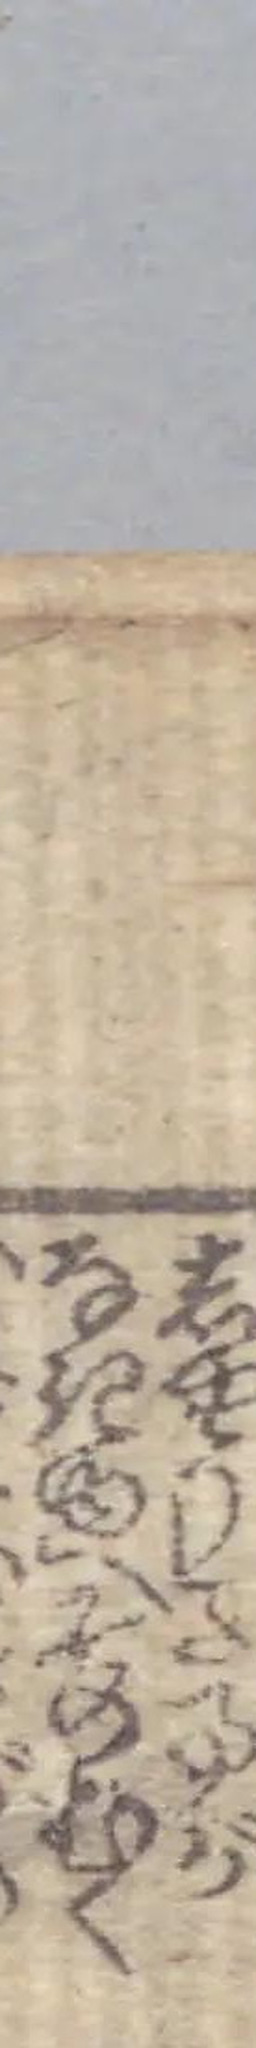なきゆいへそのむく
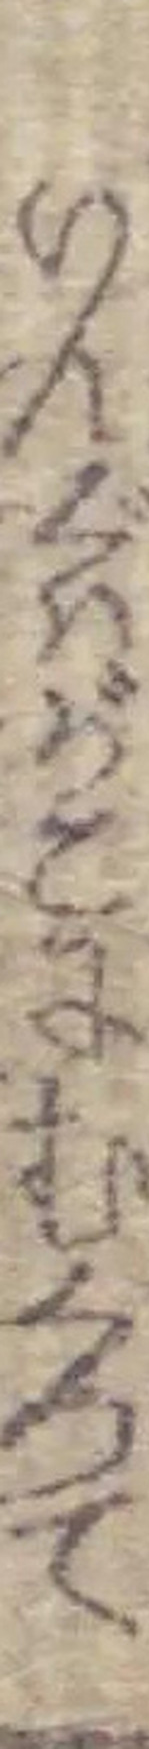いんぐはがこにむくつて
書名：化物尽 4巻
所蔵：国立国会図書館 National Diet Library, JAPAN
